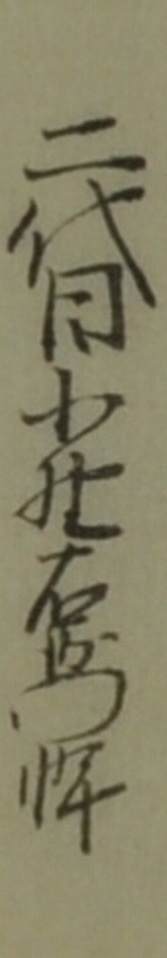二代目小野右衛門忰
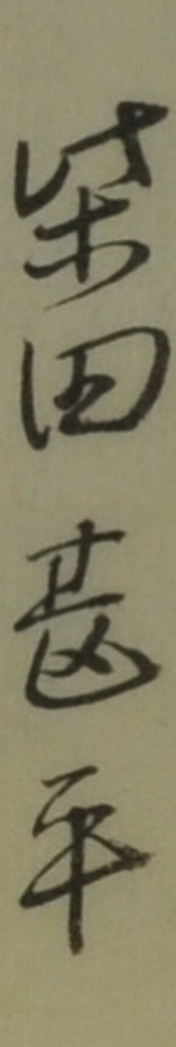柴田甚平
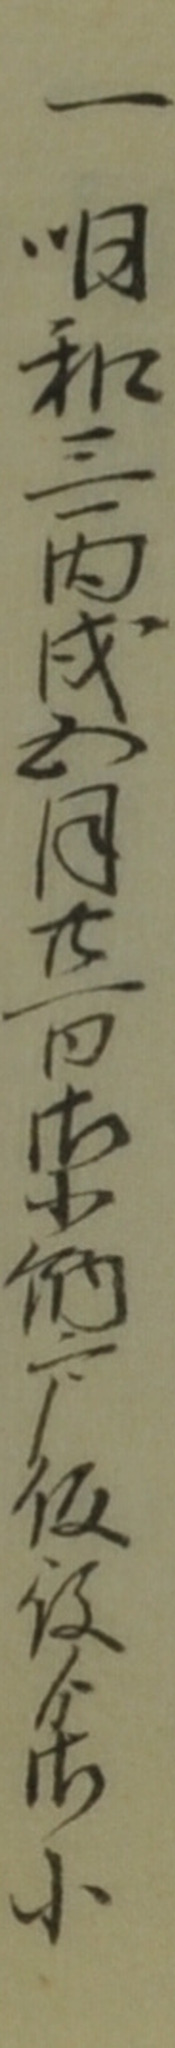一明和三丙戌五月廿一日御小納戸方ゟ御小
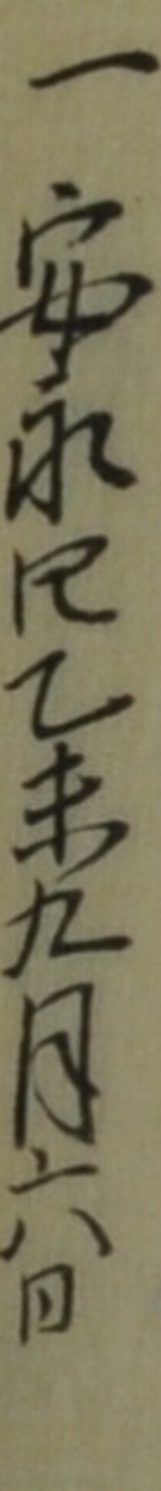一安永四乙未九月六日
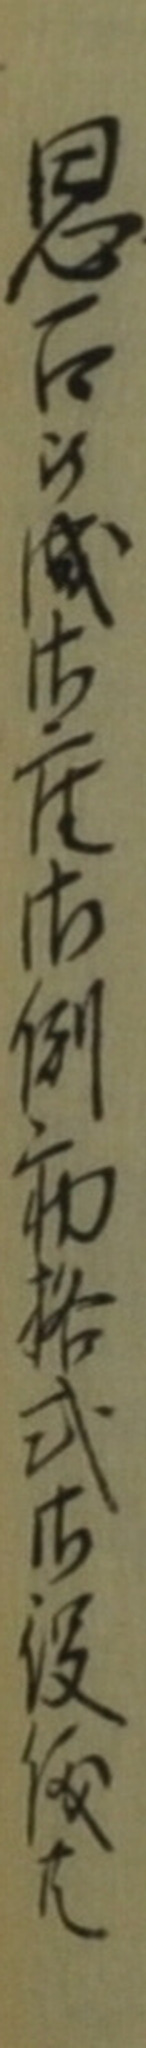思召被成御座御例勤格式御役儀共
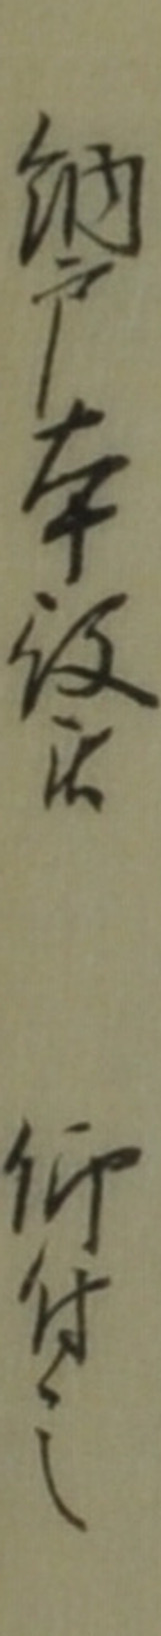納戸本役被仰付之
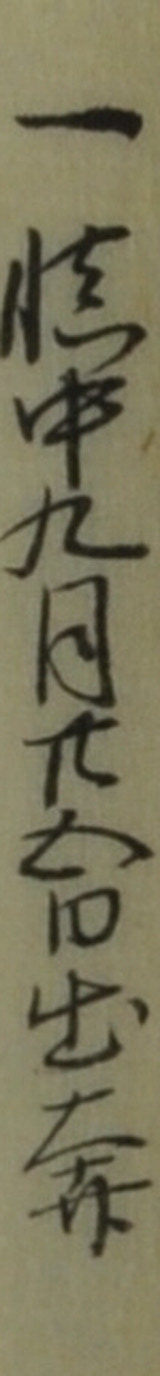一慎中九月廿五日出奔
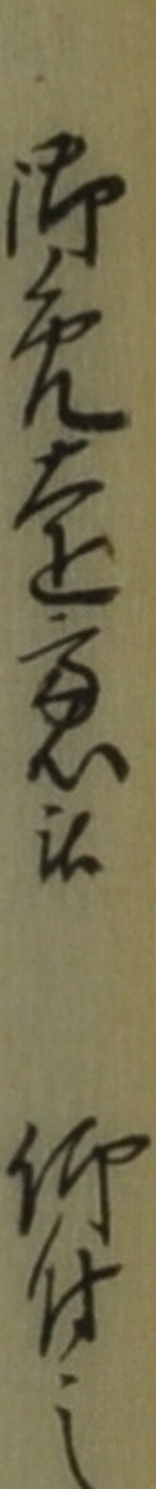御免遠慮被仰付之
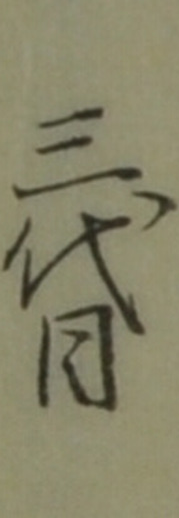三代目
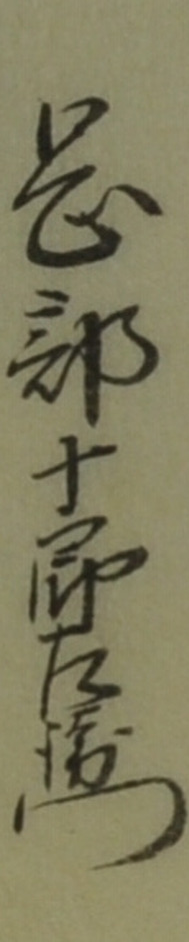岡部十郎左衛門
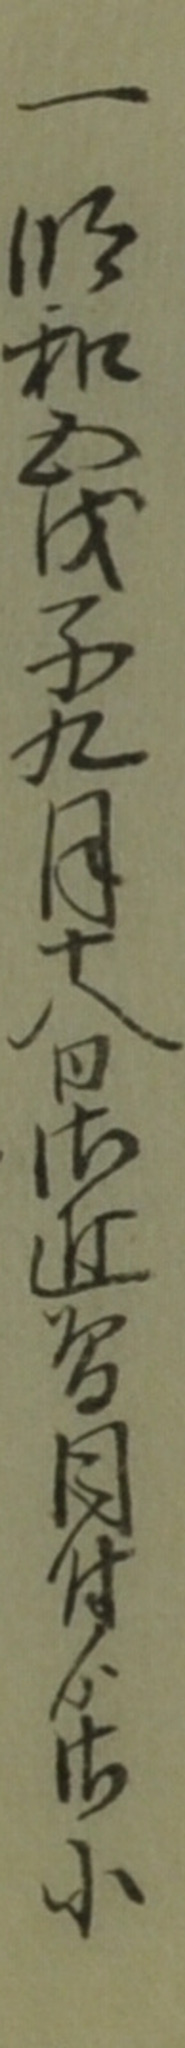一明和五戊子九月十八日御近習目付ゟ御小
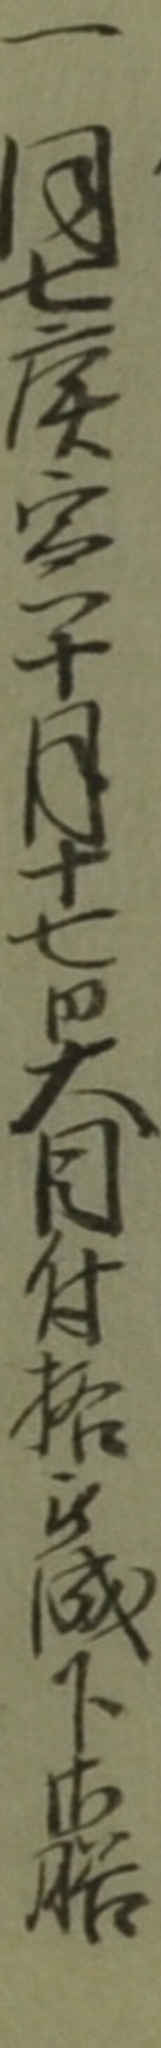一同七庚寅十月十七日大目付格被成下御膳
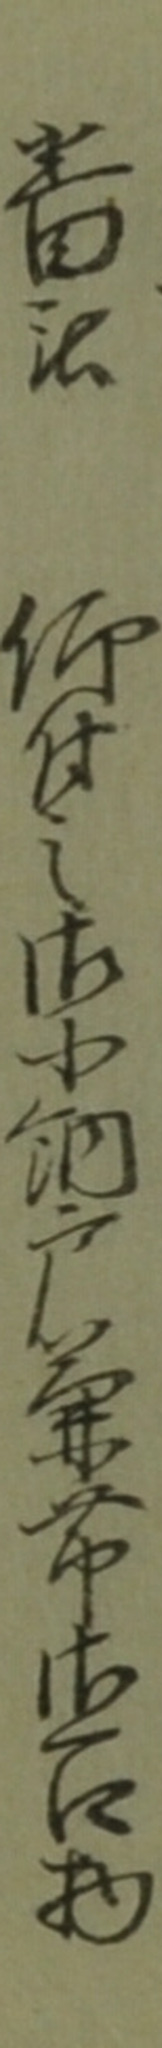番被仰付之御小納戸兼帯御召物
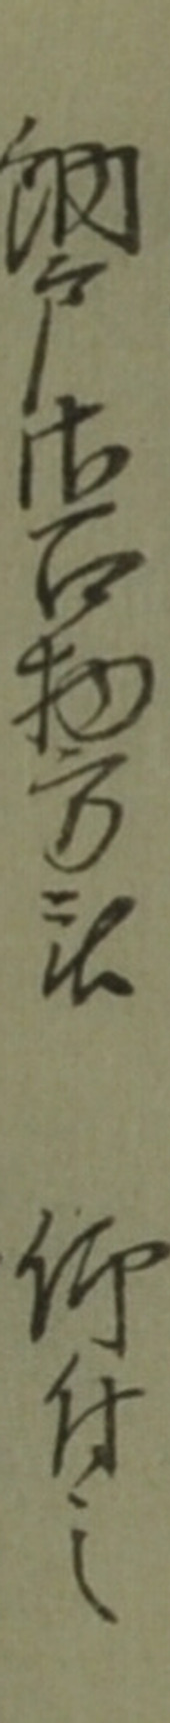納戸御召物方被仰付之
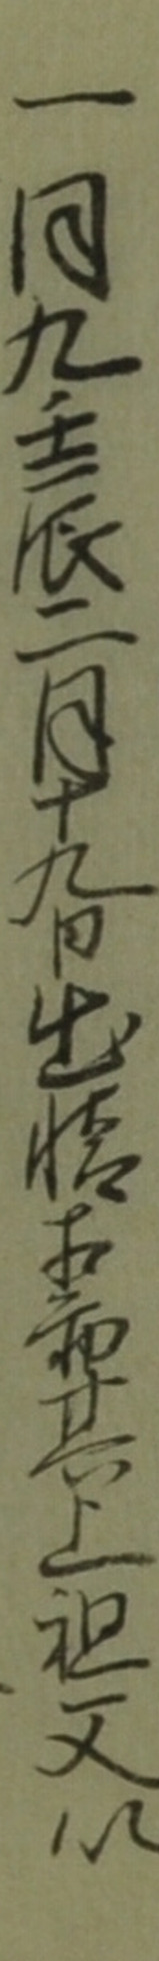一同九壬辰二月十九日出精相勤其上祖父以
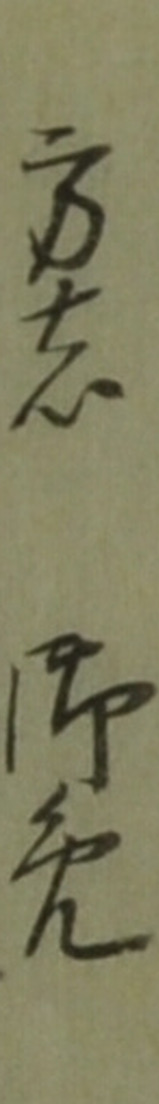方者御免
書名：諸御役代々録（四）
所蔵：伊那市立高遠町図書館・合同会社AMANE
